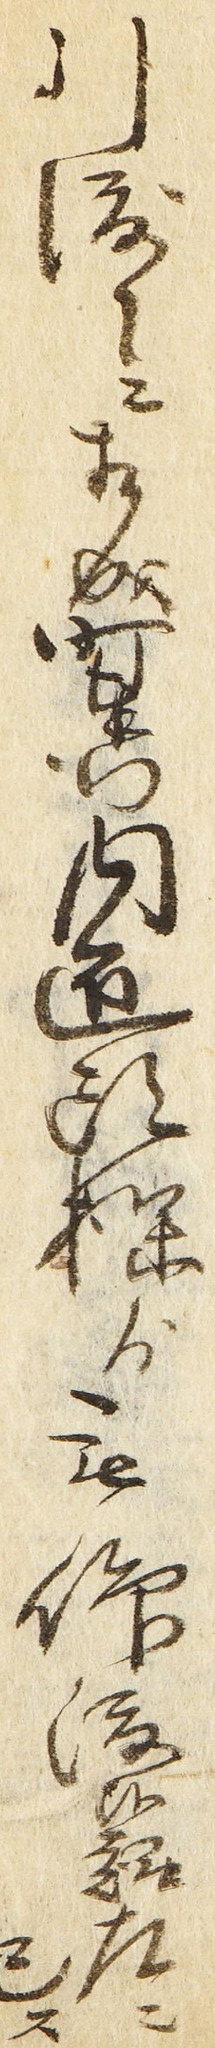引渡しに相成町奉行内匠頭様ゟ被仰渡候趣左に記す

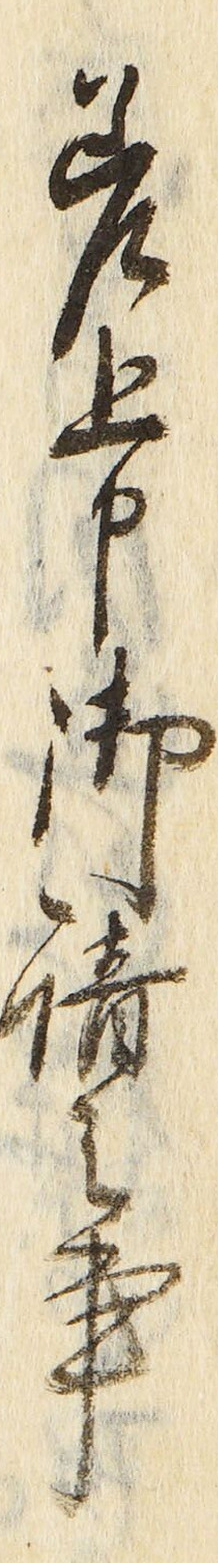差上申御請之事
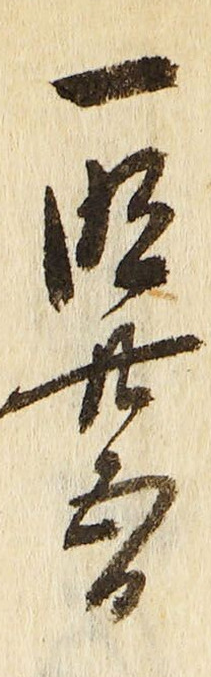一明廿五日
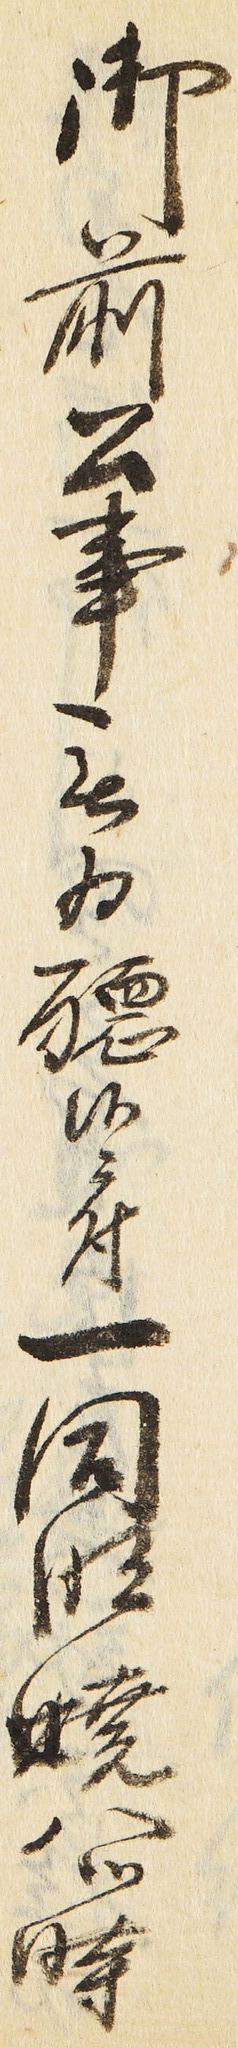御前公事被為聴候に付一同明暁八ツ時
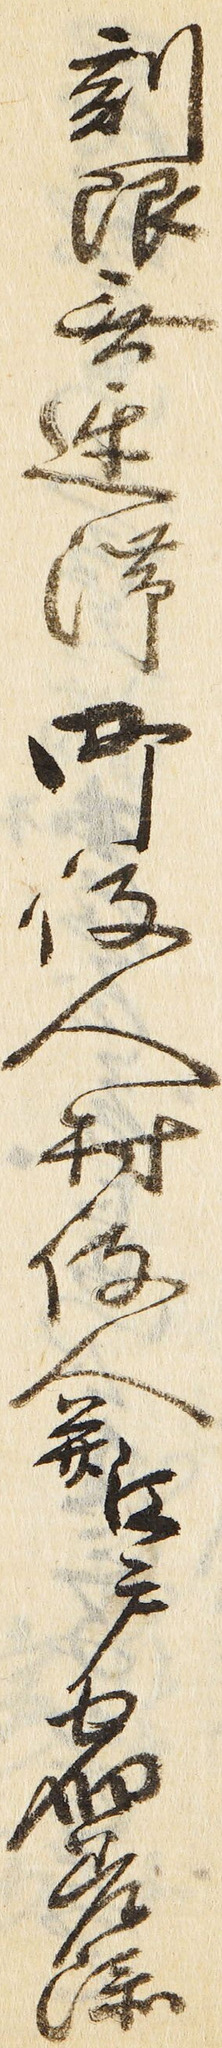刻限無遅滞町役人村役人幷江戸宿差添
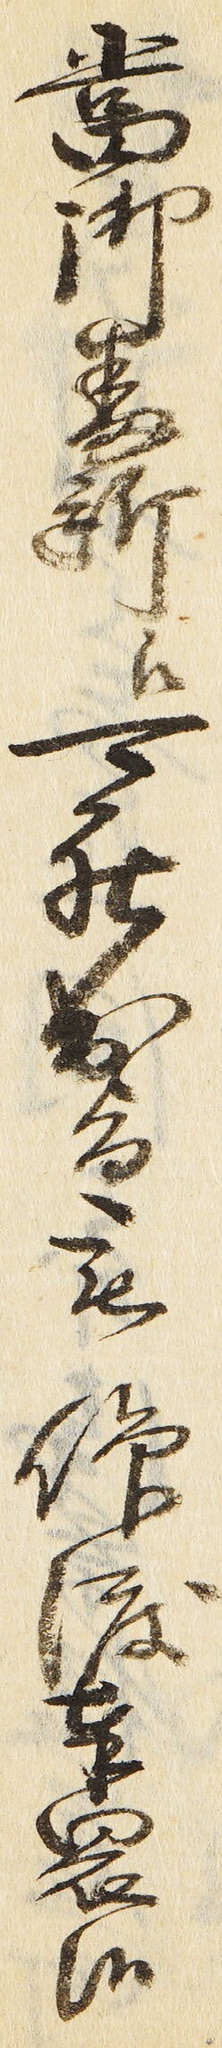当御番所江可罷出旨被仰渡奉畏候
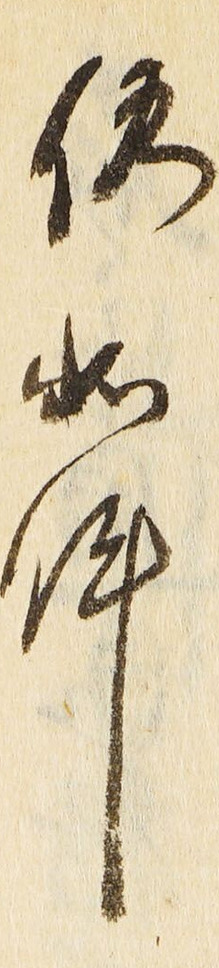仍如件
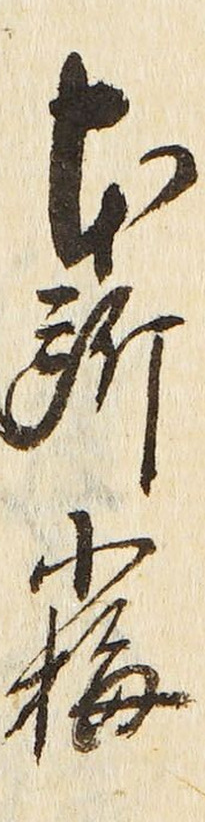本所小梅
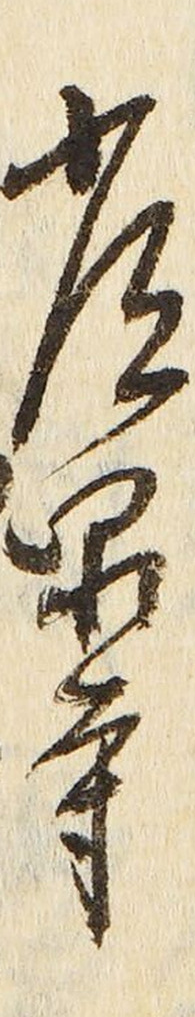常泉寺
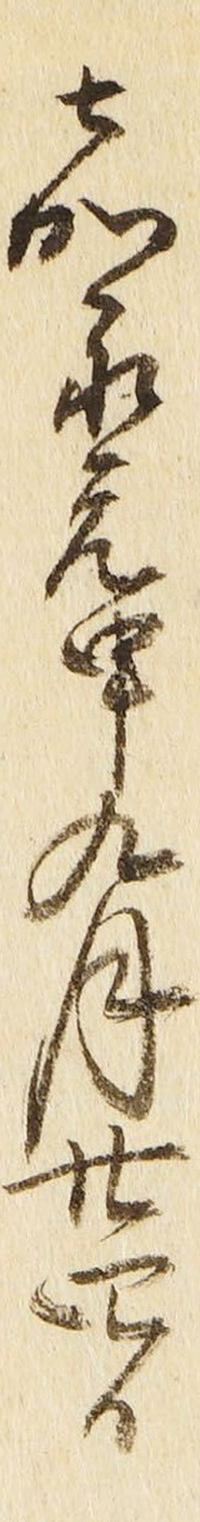嘉永元申九月廿四日
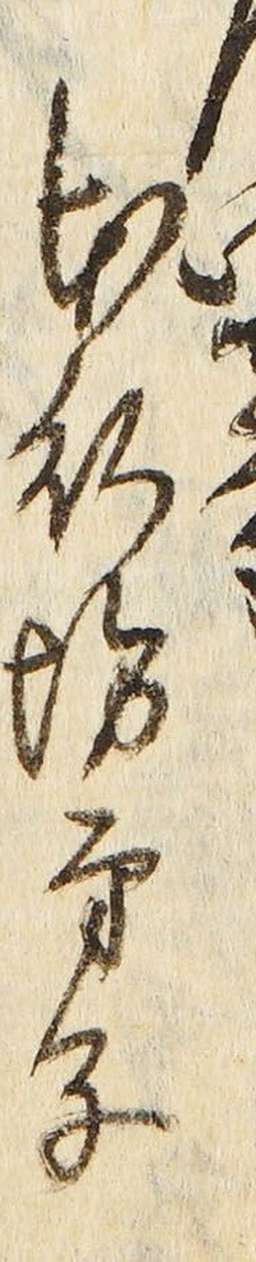本役坊弟子
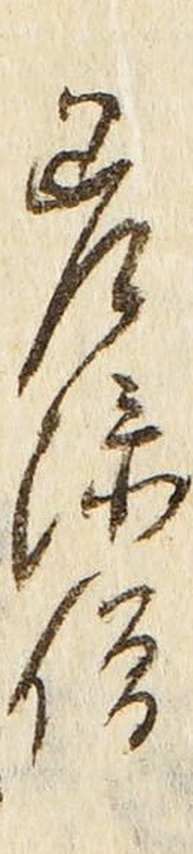差添僧
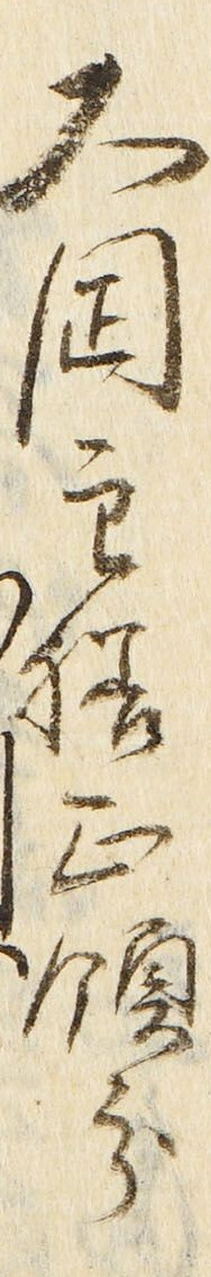大岡主膳正領分
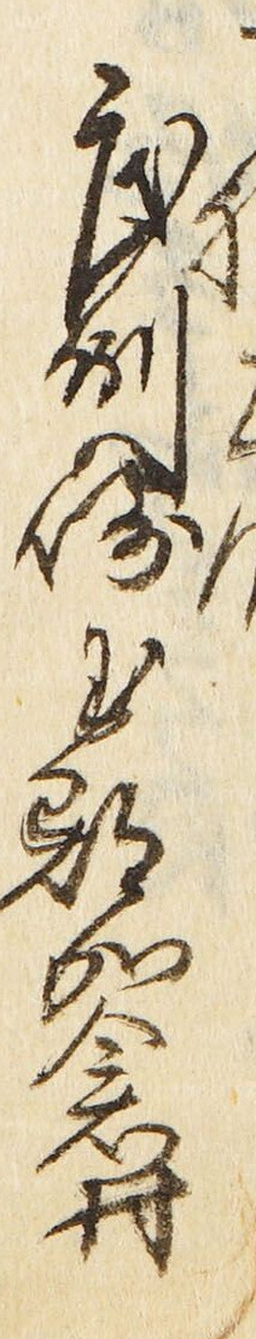武州崎玉郡加倉村
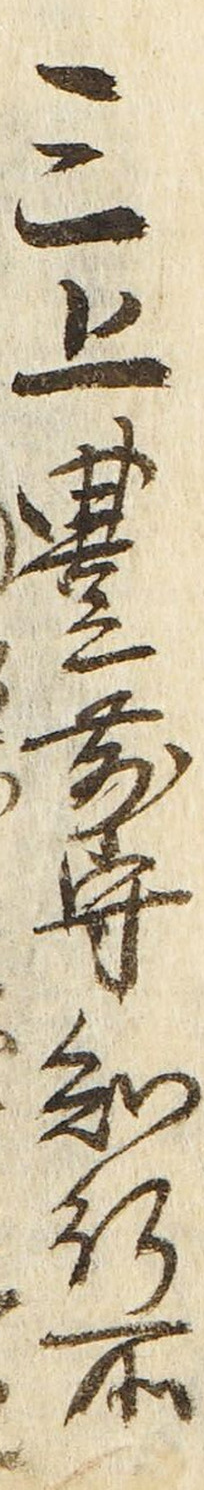三上豊前守知行所
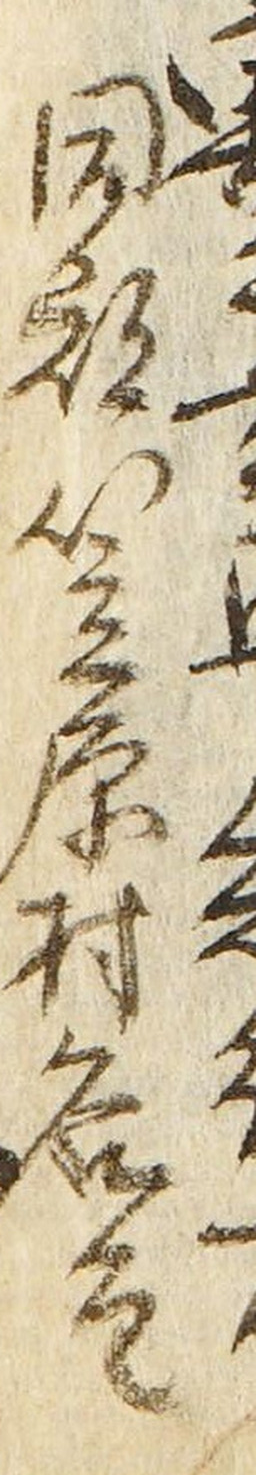同郡笠原村名主
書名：異流一件日記
